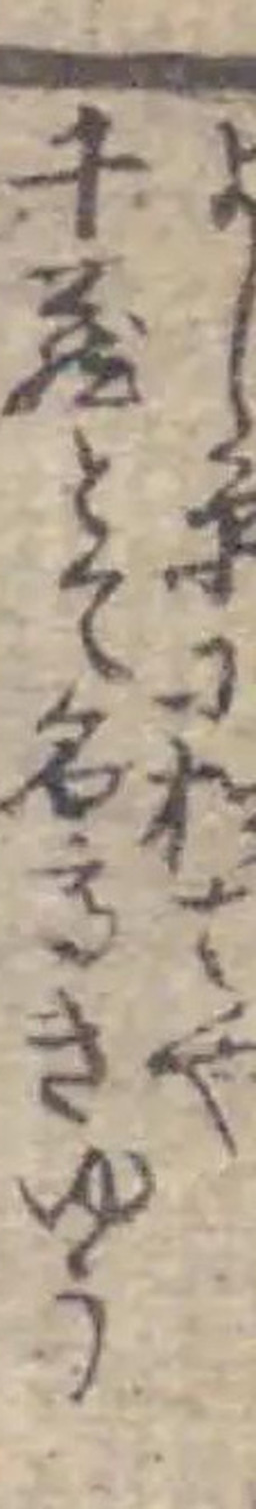千蔵とて名高きゆう
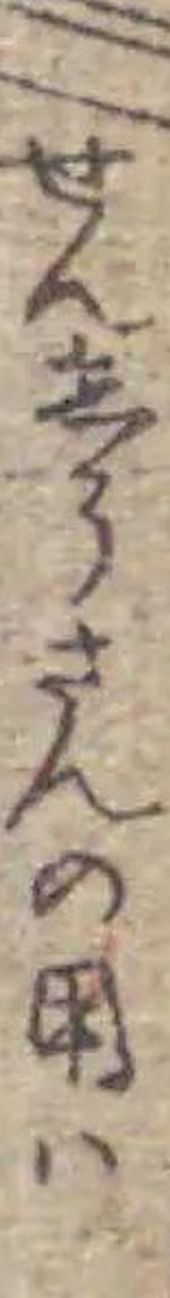せんしうさんの用は
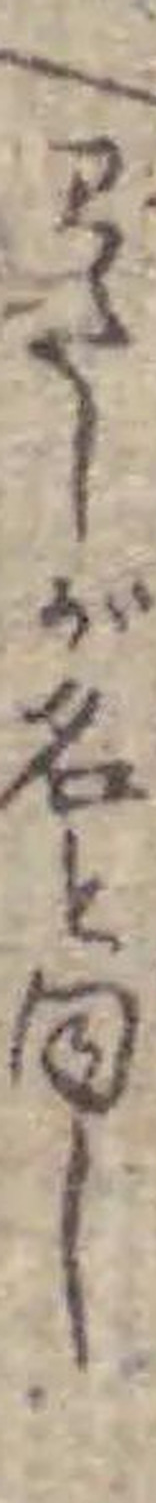わたしが名と同し
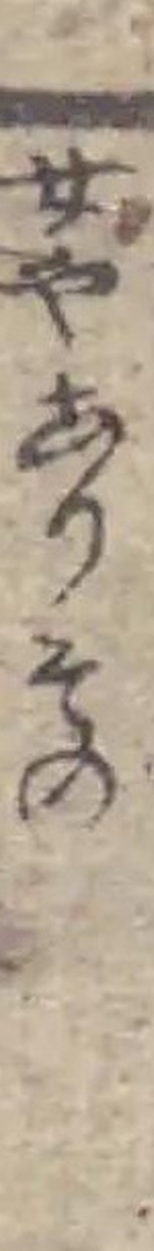女やありその
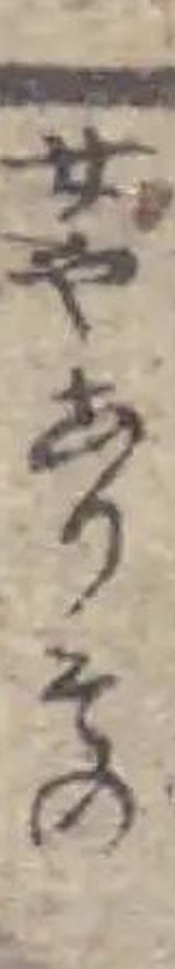女やありその
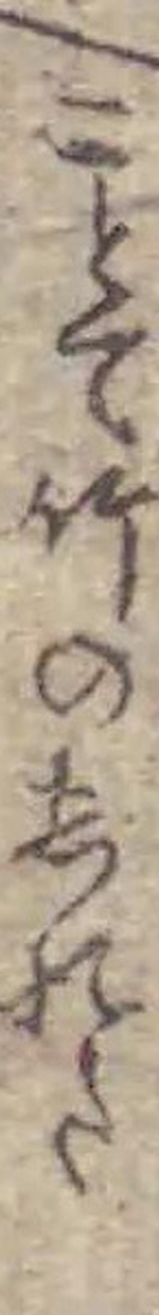ことて竹のしれた
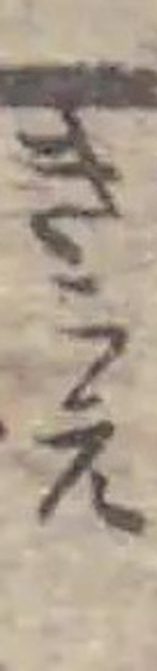きこえ
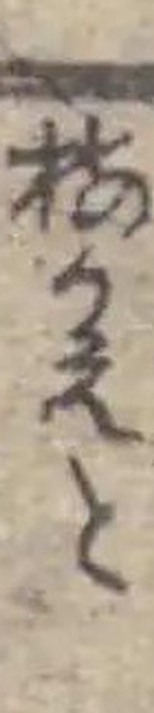梅かえと
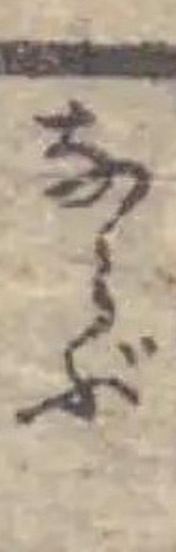ならぶ
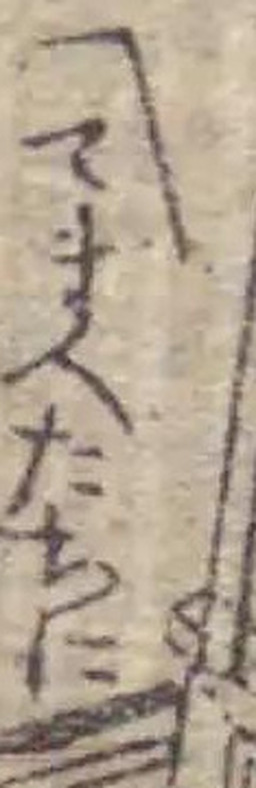〽てまへたちに
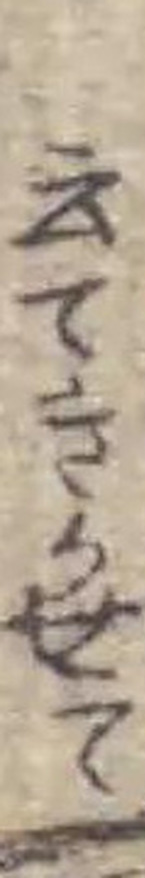云てきかせて
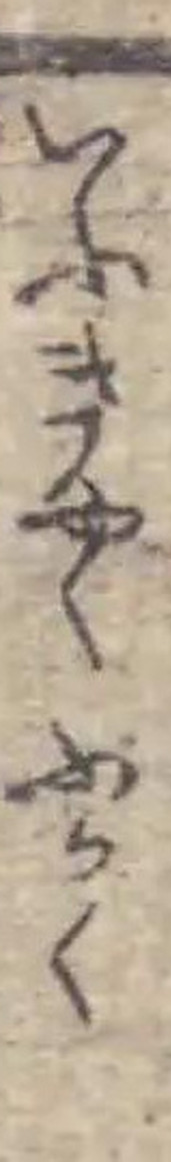いふきやくふかく
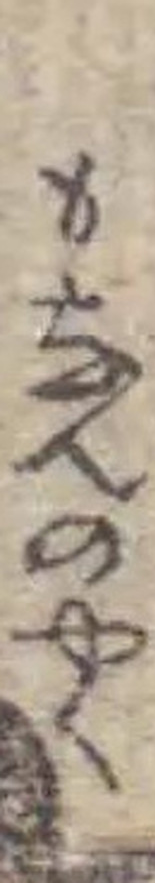もなんのやく
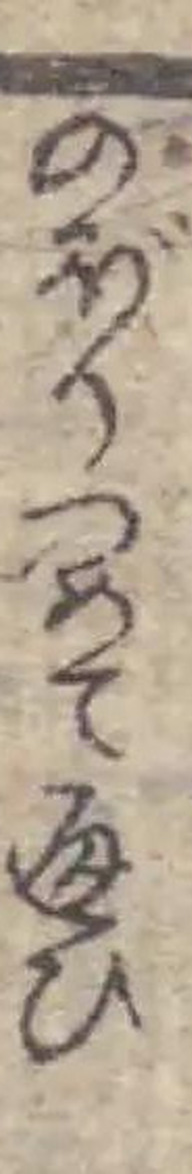のぼりつめて通ひ
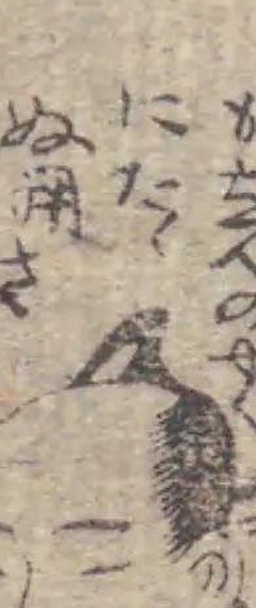ぬ用さ
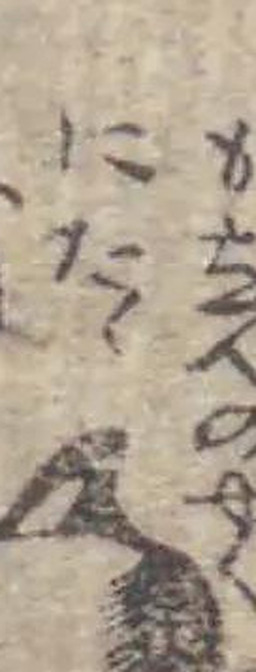にたゝ
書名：見立蓬莱 : 2巻
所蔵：国立国会図書館 National Diet Library, JAPAN
